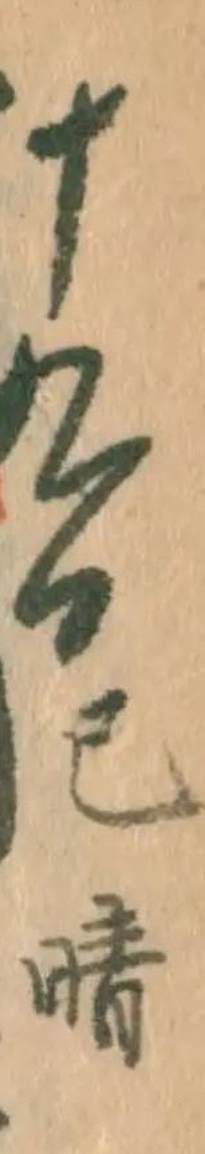十九日巳晴
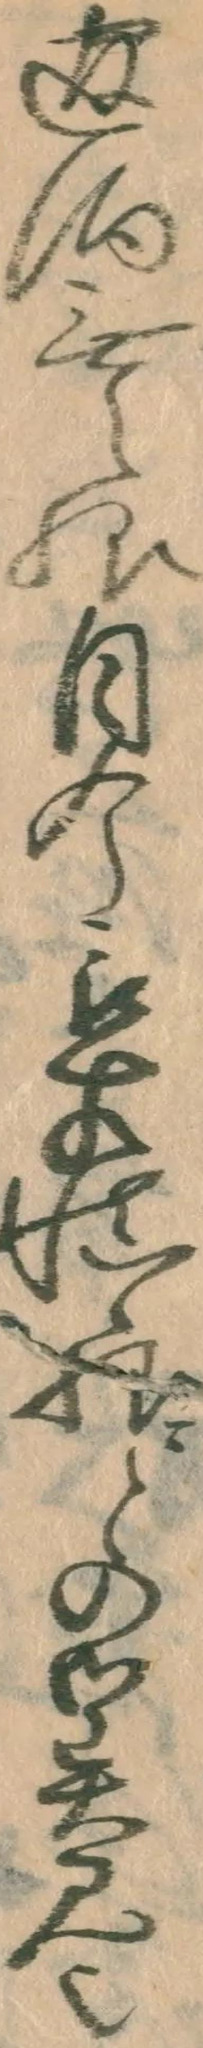返？酒無之様自今被相慎候様ニとの御異見也
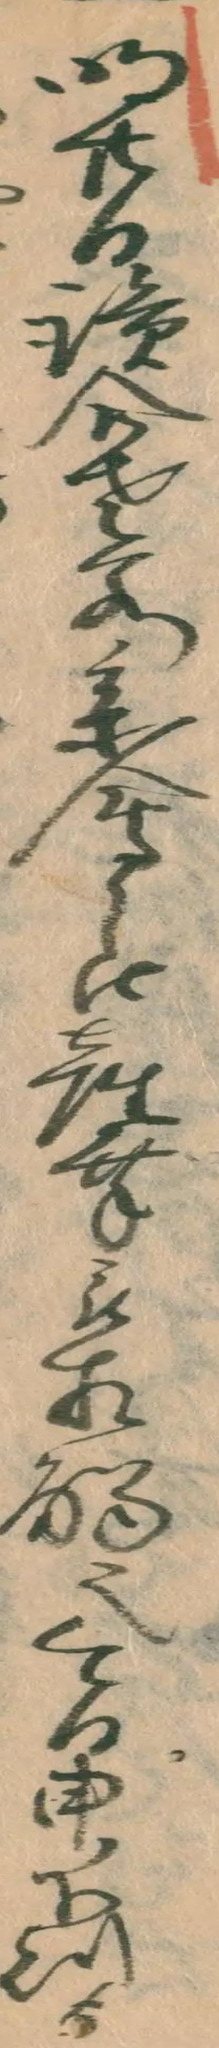一明廿日読合老若参会之由産幸被相触也今日申ノ下刻ゟ
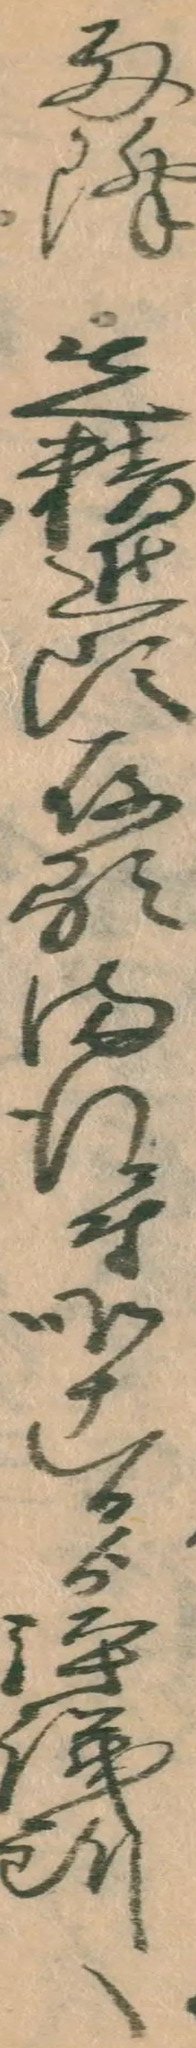雨降先精進頭存顕帰行ニ付昨十八日ゟ評議所へ
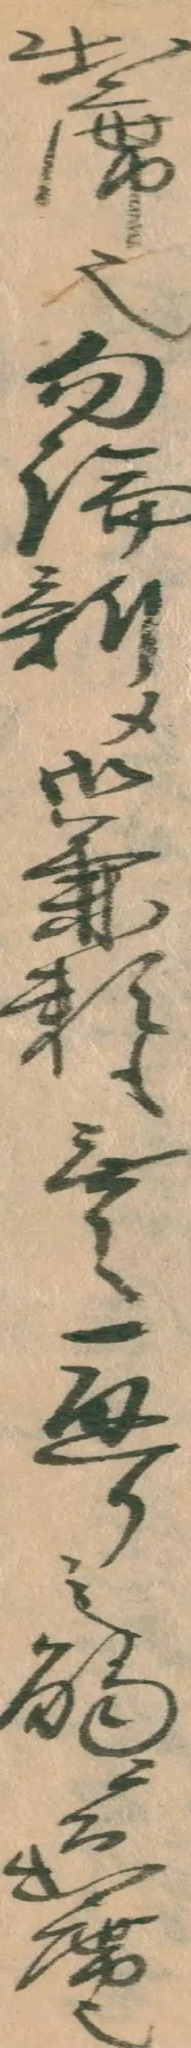出席也勿論新メ御兼頼も無之一通り之触ニ而出席也
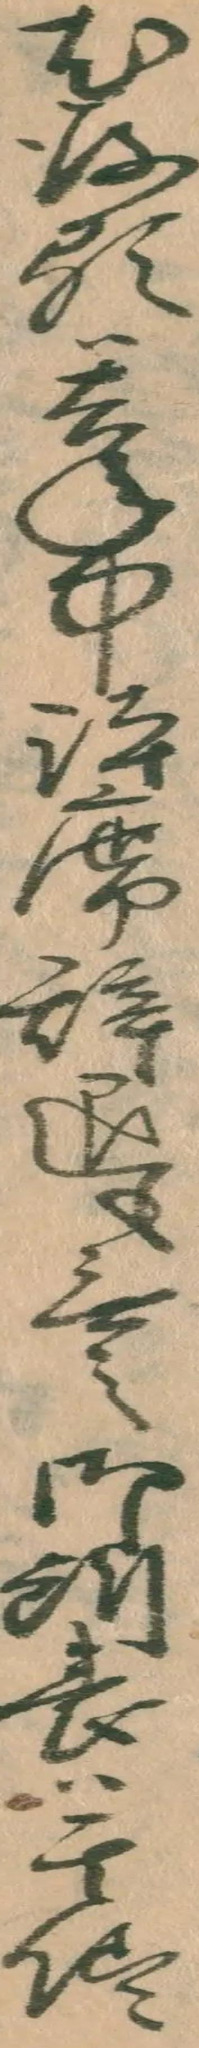尤存顕ハ去年中評席辞退も無之御所表ハ其侭
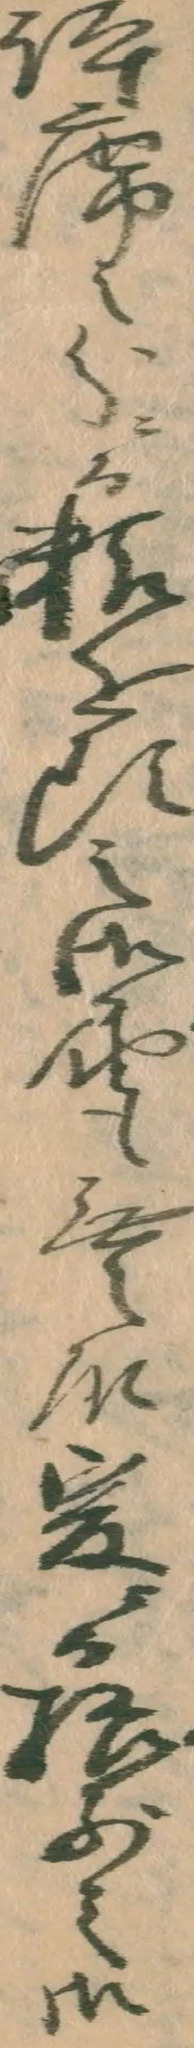評席之分ニ而精進頭之御届も無之故爰ニ而格別之御
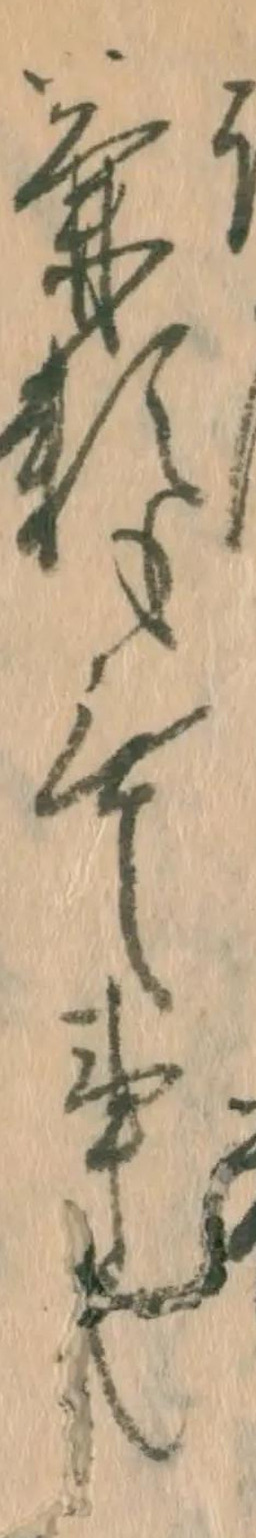兼頼も無之事也
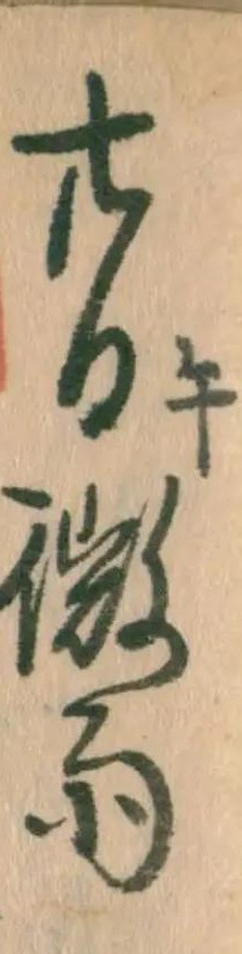廿日午微雨
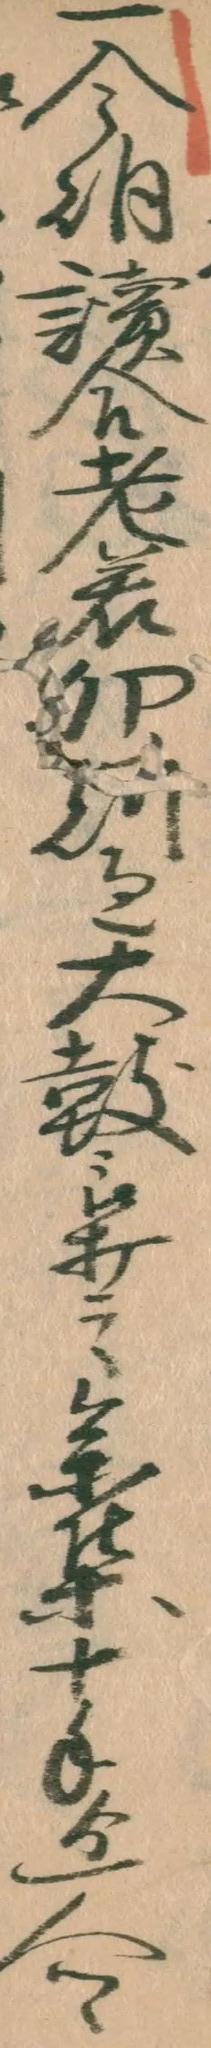一今朝読合老若卯刻過大鼓被打之参集十手ゟ一人ツヽ
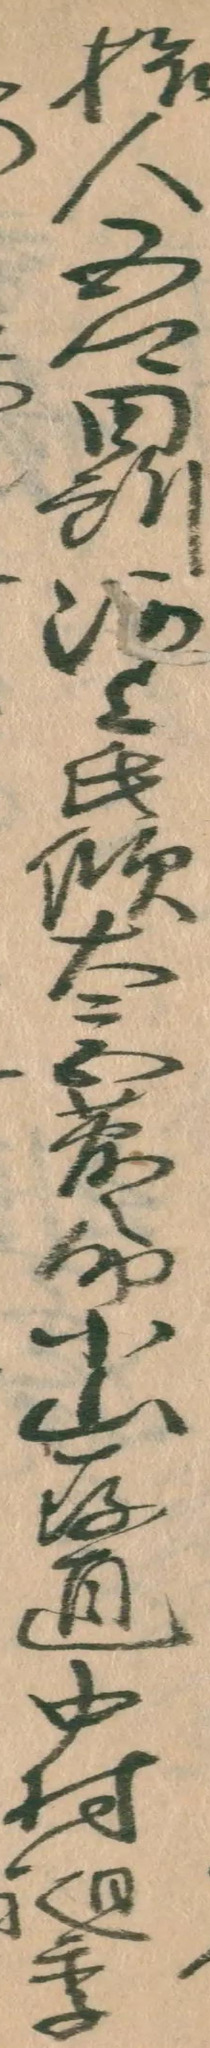拾人五郷田所河上氏領大宮菅之助小山存直中村昶季
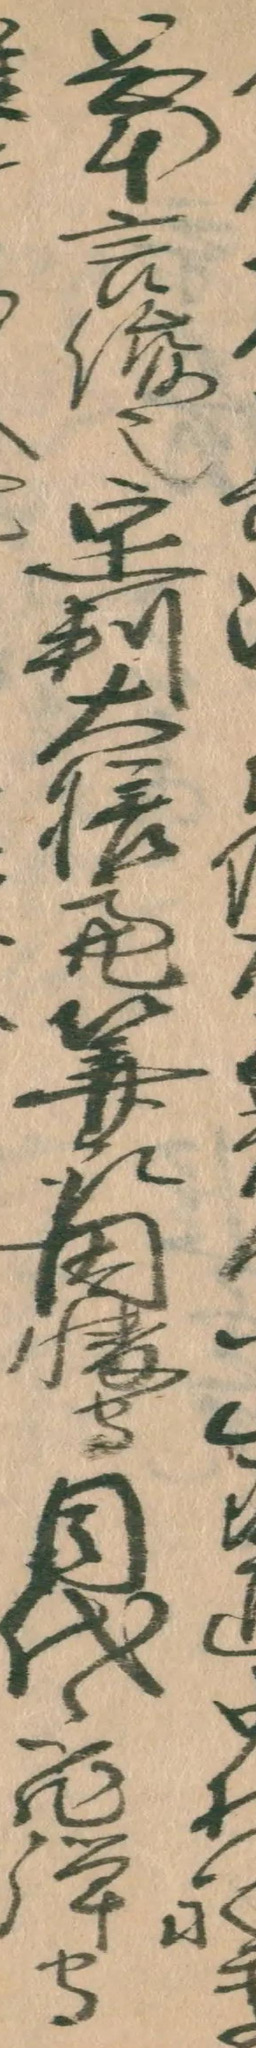岡本言俊也定判大膳亮算取因幡守目代之飛騨守
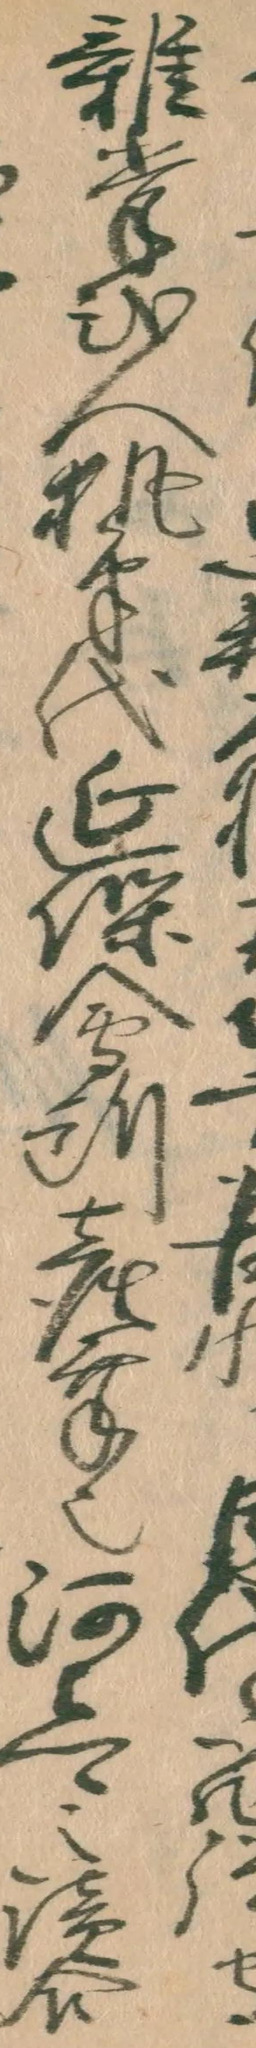雑掌弐人執筆代延保会所産幸也河上郷之読合
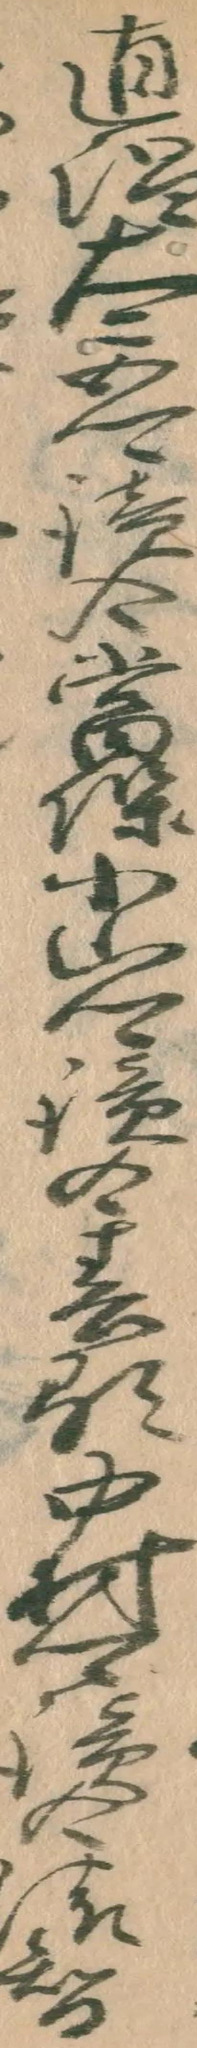直大宮郷読合当保小山郷読合春顕中村郷読合清智
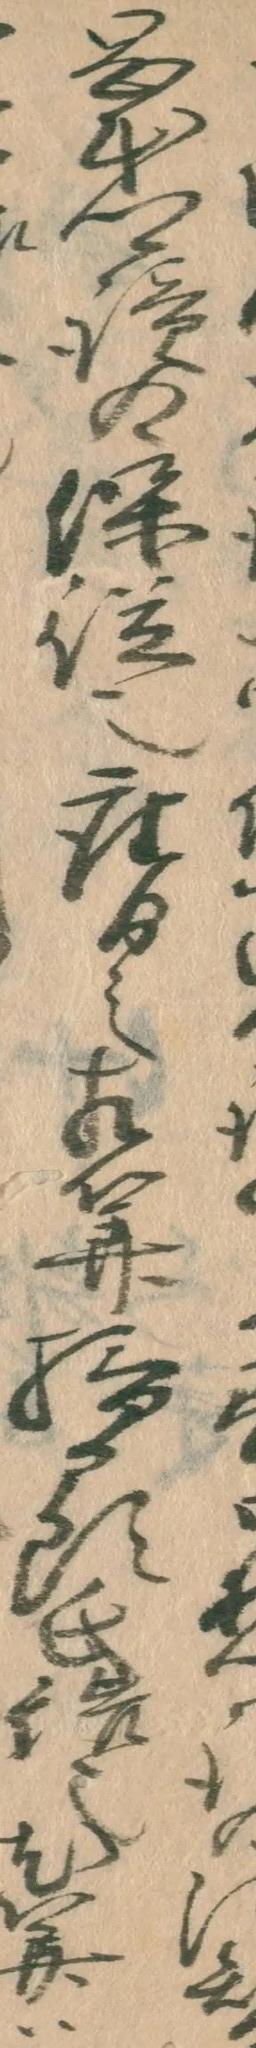岡本郷読合保従也座ゟ之相算掃部頭氏也尤算ハ
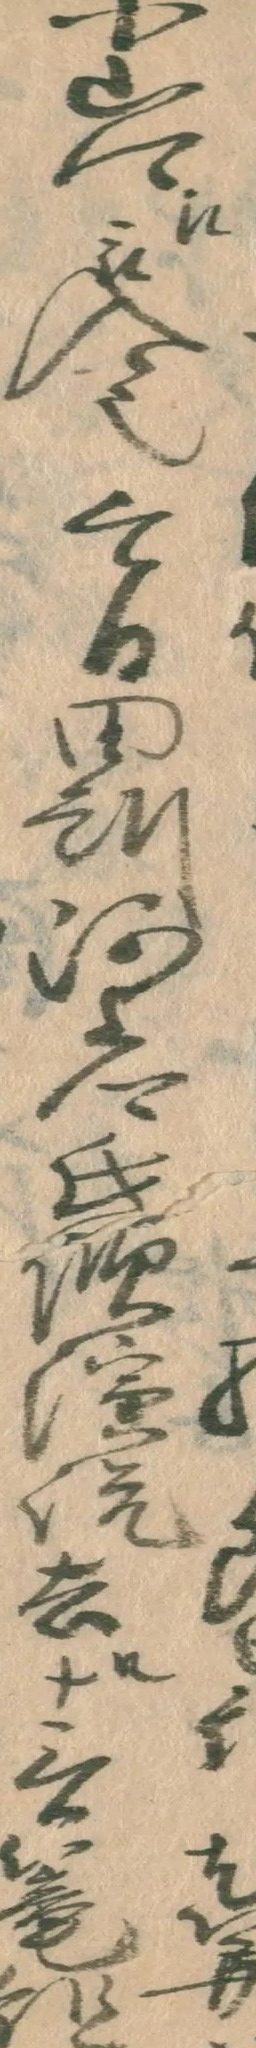小山郷江被入候也今日田所河上郷氏領演説去ル十三日篭組
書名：賀茂社記録. 第60冊
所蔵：国立国会図書館 National Diet Library, JAPAN
